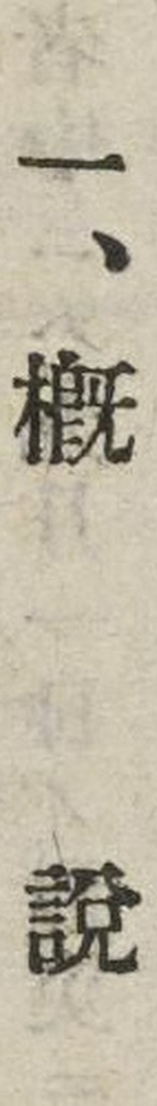一、概説
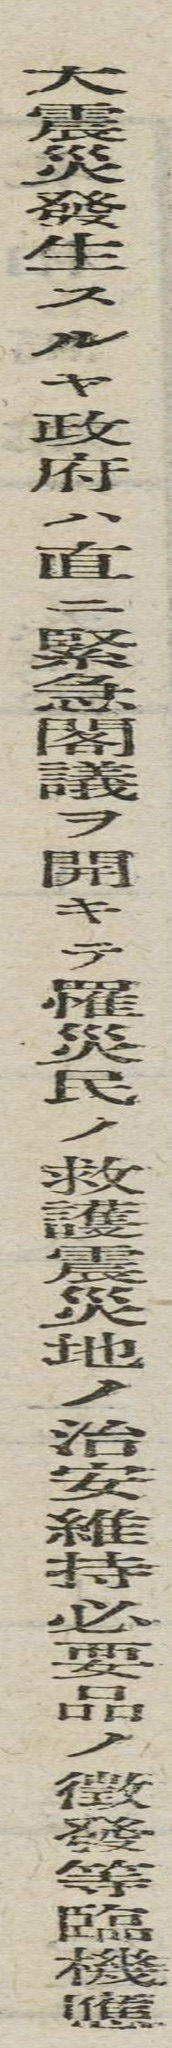大地震発生スルヤ政府ハ直ニ緊急閣議ヲ開キテ罹災民ノ救護震災地ノ治安維持必需品ノ徴発等臨機応
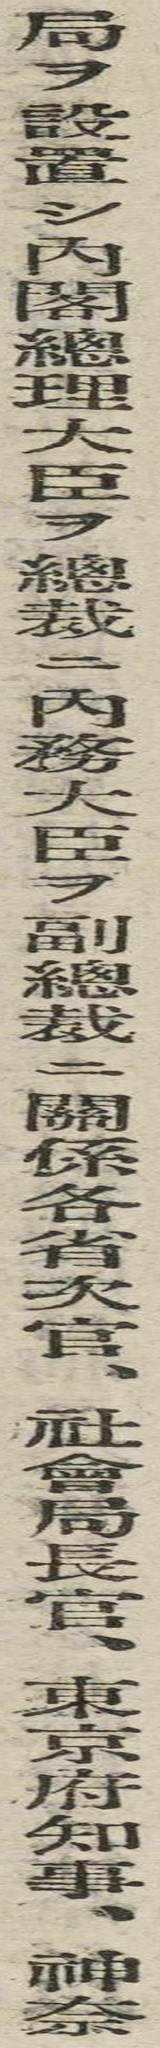局ヲ設置シ内閣総理大臣ヲ総裁ニ内務大臣ヲ副総裁ニ関係各省次官、社会局長官、東京府知事、神奈
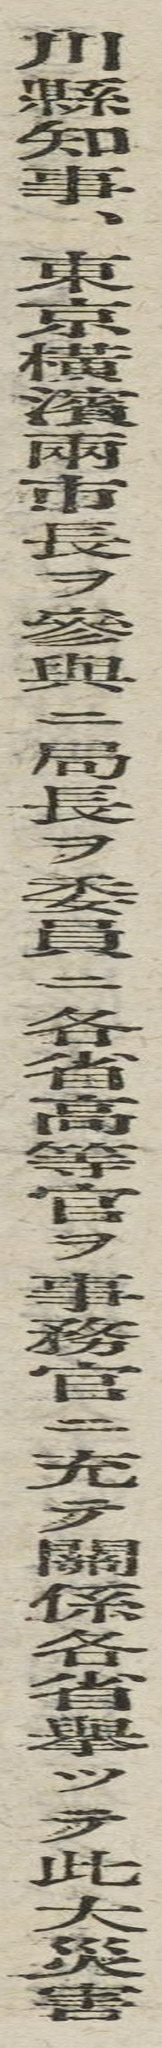川県知事、東京横浜両市町ヲ参与ニ局長ヲ委員ニ各省高等官ヲ事務官ニ充テ関係各省挙ツテ此大災害
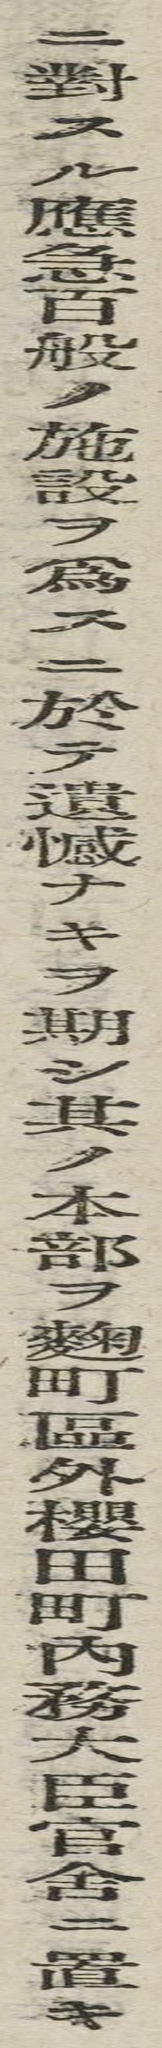ニ対スル応急百般ノ施設ヲ為スニ於テ遺憾ナキヲ期シ其ノ本部ヲ麹町区外桜田町内務大臣官舎ニ置キ
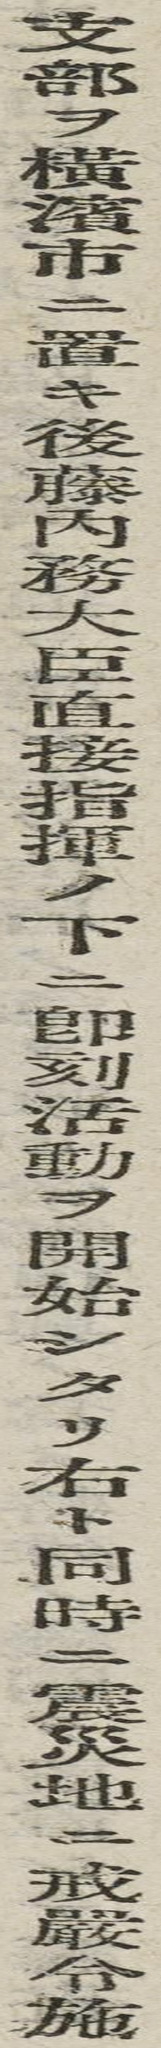支部ヲ横浜市ニ置キ後藤内務大臣直接指揮ノ下ニ即刻活動ヲ開始シタリ右ト同時ニ震災地ニ戒厳令施
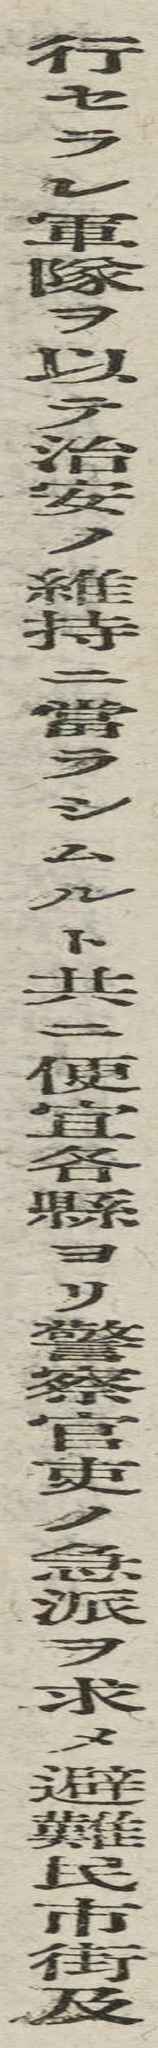行セラレ軍隊ヲ以テ治安ノ維持ニ当ラシムルト共ニ便宜各県ヨリ警察官吏ノ急派ヲ求メ避難民市街及
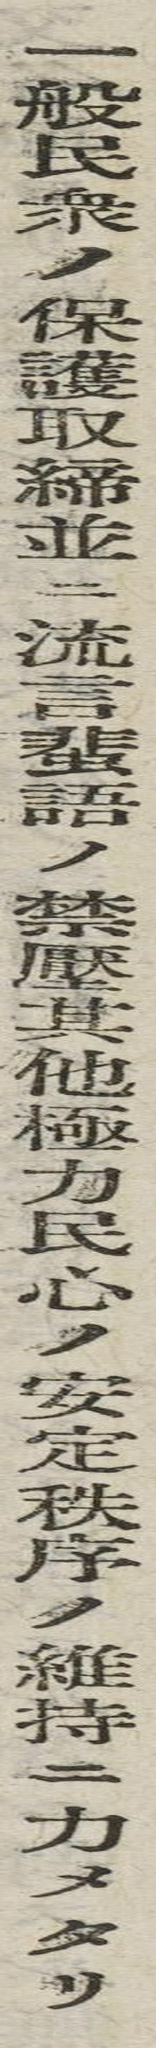一般民衆ノ保護取締並ニ流言蜚語ノ禁圧其他極力民心ノ安定秩序ノ維持ニ力メタリ
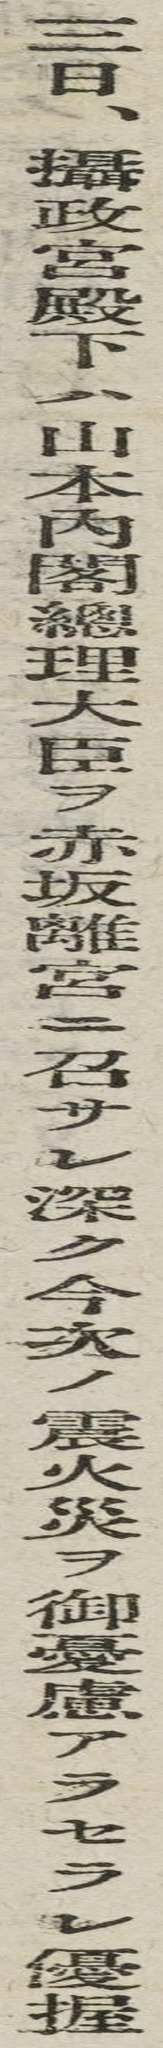三日、摂政宮殿下ハ山本内閣総理大臣ヲ赤坂離宮ニ召サレ深ク今次ノ震火災ヲ御憂慮アラセラレ優握
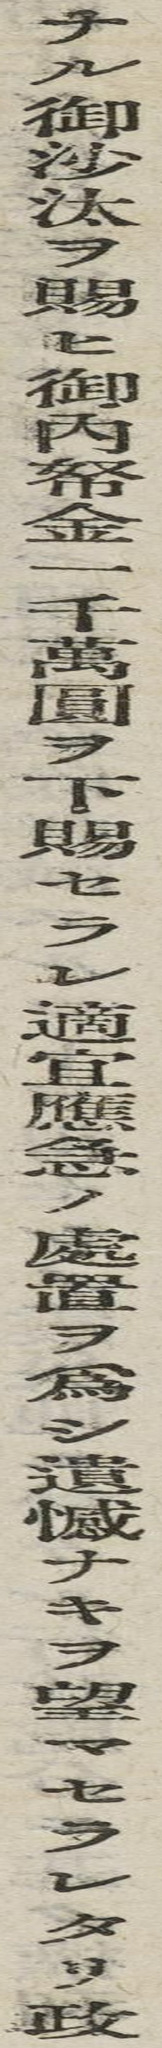ナル御沙汰ヲ賜ヒ御内帑金一千万円ヲ下賜セラレ適宜応急ノ処置ヲ為シ遺憾ナキヲ望マセラレタリ政
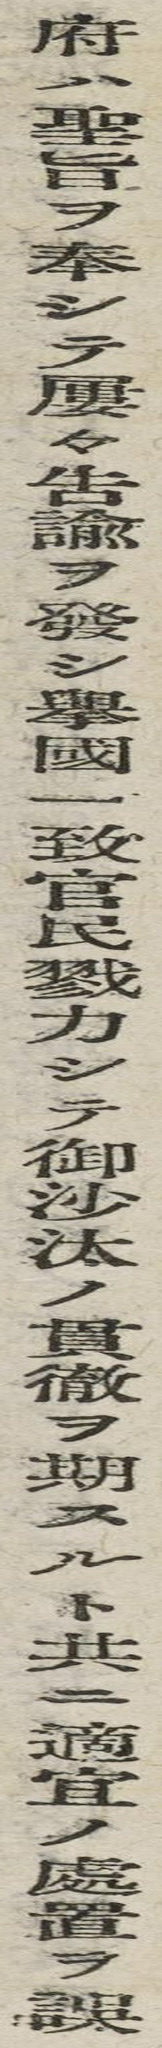府ハ聖旨ヲ奉シテ屢々告諭ヲ発シ挙国一致官民戮力シテ御沙汰ノ貫徹ヲ期スルト共ニ適宜ノ処置ヲ誤
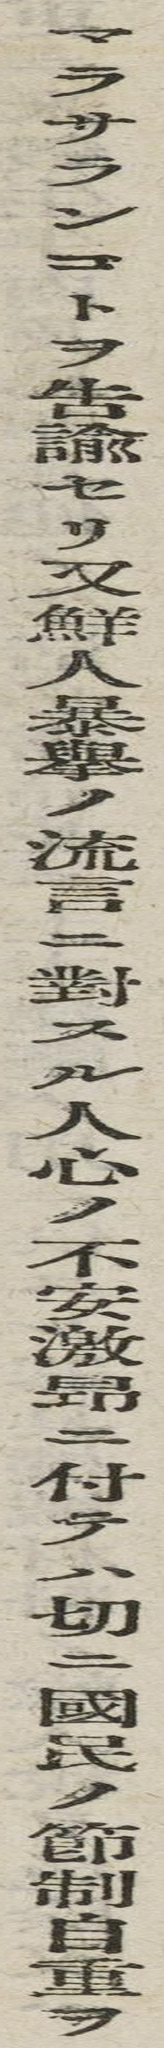マラサランコトヲ告諭セリ又鮮人暴挙ノ流言ニ対スル人心ノ不安激昂ニ付テハ切ニ国民ノ節制自重ヲ
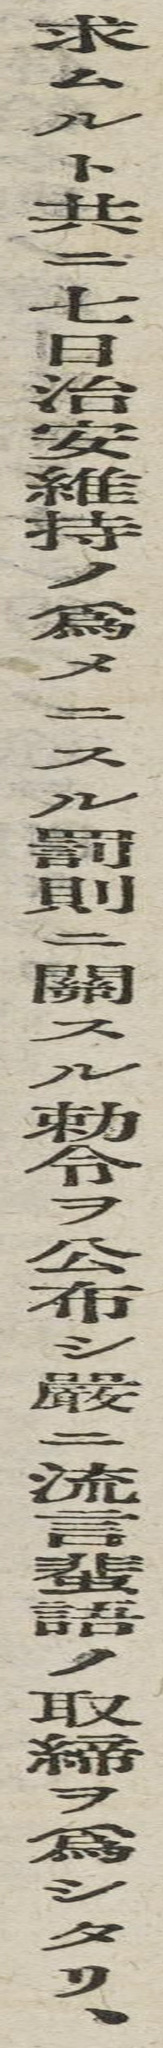求ムルト共ニ七日治安維持ノ為メニスル罰則ニ関スル勅令ヲ公布シ厳ニ流言蜚語ノ取締ヲ為シタリ、
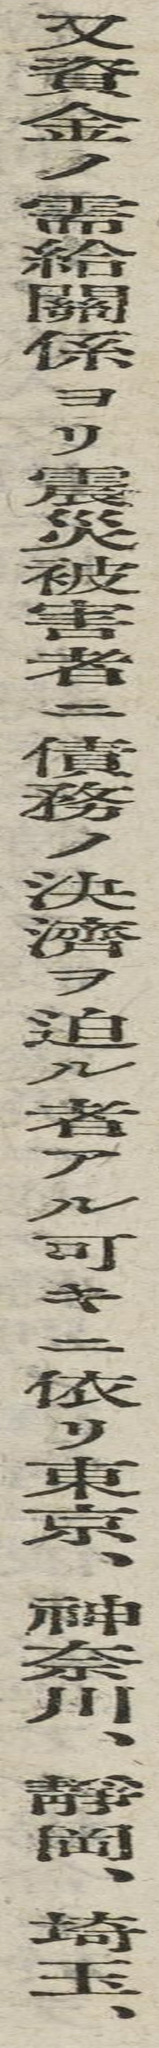又資金ノ需給関係ヨリ震災被害者ニ債務ノ決済ヲ迫ル者アル可キニ依リ東京、神奈川、静岡、埼玉、
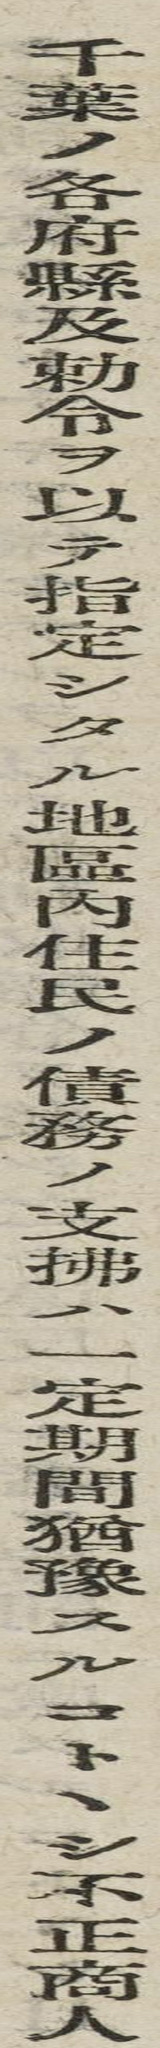千葉ノ各府県及勅令ヲ以テ指定シタル地区内住民ノ債務ノ支払ハ一定期間猶予スルコトヽシ不正商人

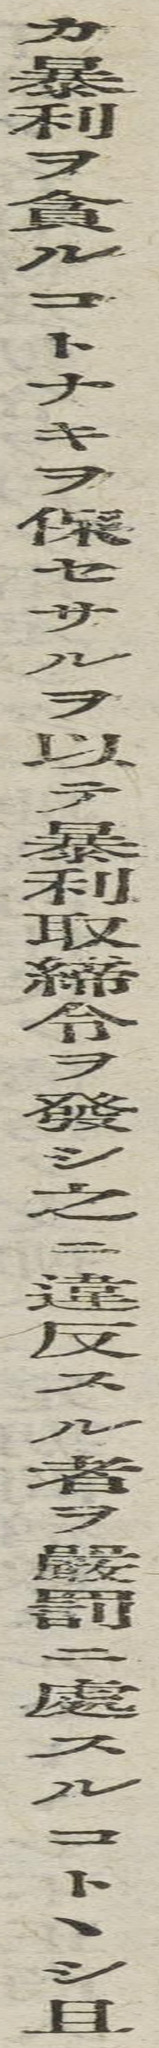カ暴利ヲ貪ルコトナキヲ保セサルヲ以テ暴利取締令ヲ発シ之ニ違反スル者ヲ厳罰ニ処スルコトヽシ且
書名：震災被害状況並救護施設概要
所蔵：東京大学地震研究所図書室 Earthquake Research Institute Library, The University of Tokyo, JAPAN
